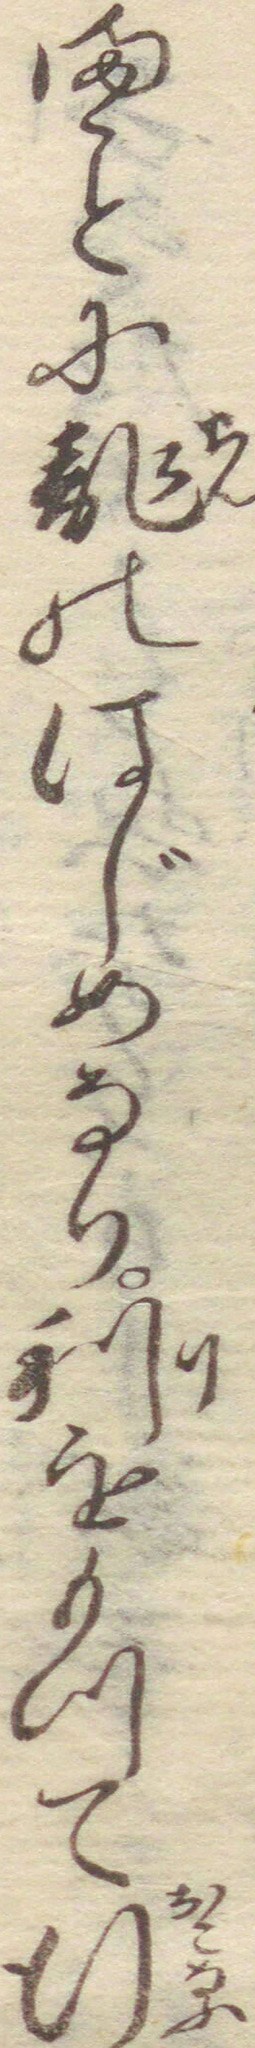まことに乱のはじめなり。利をもつて行
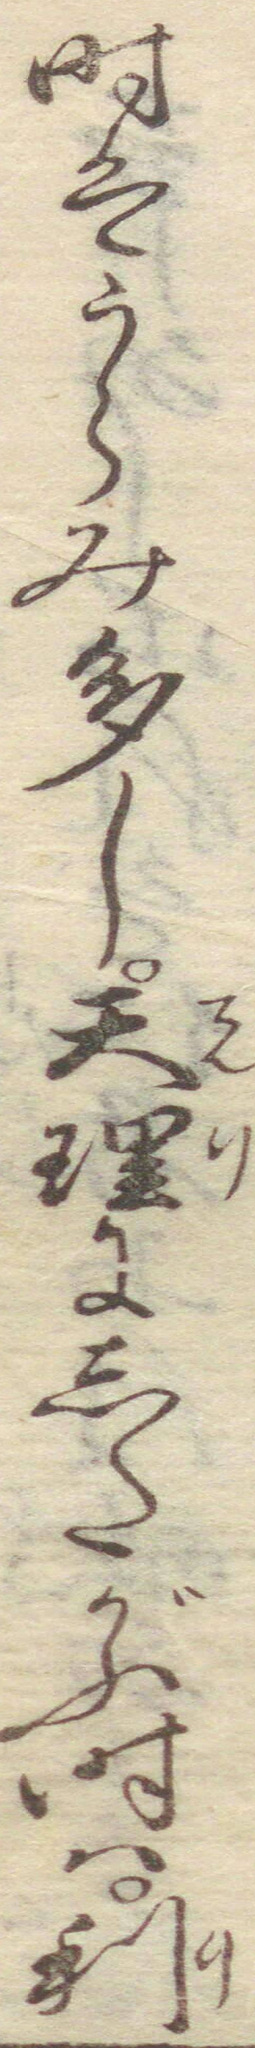時はうらみ多し。天理にしたがふ時は。利
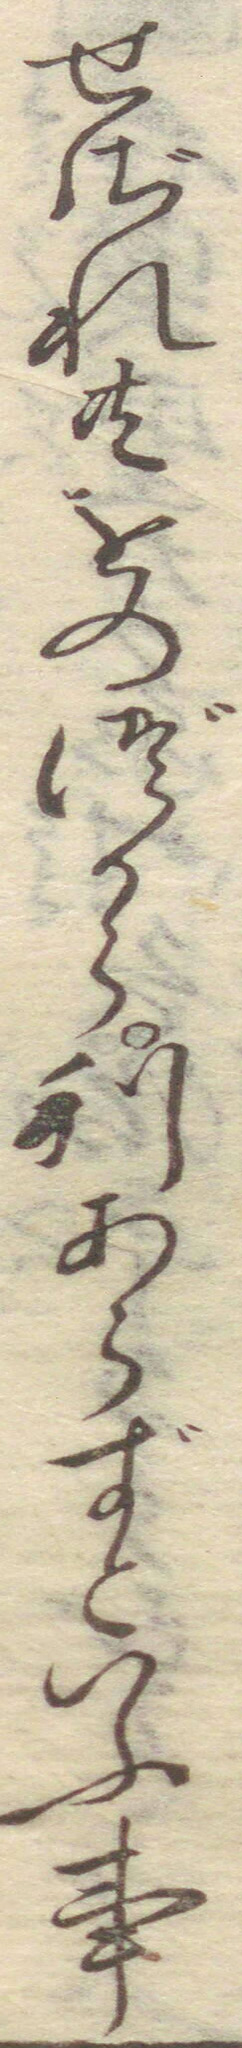せざれ共をのづから。利あらずといふ事
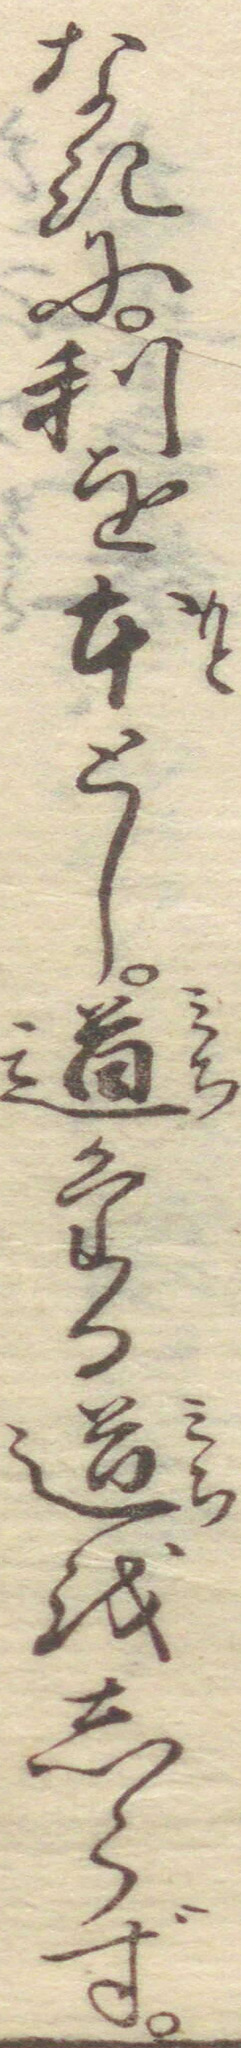なきに。利を本とし。道たる道をしらず。
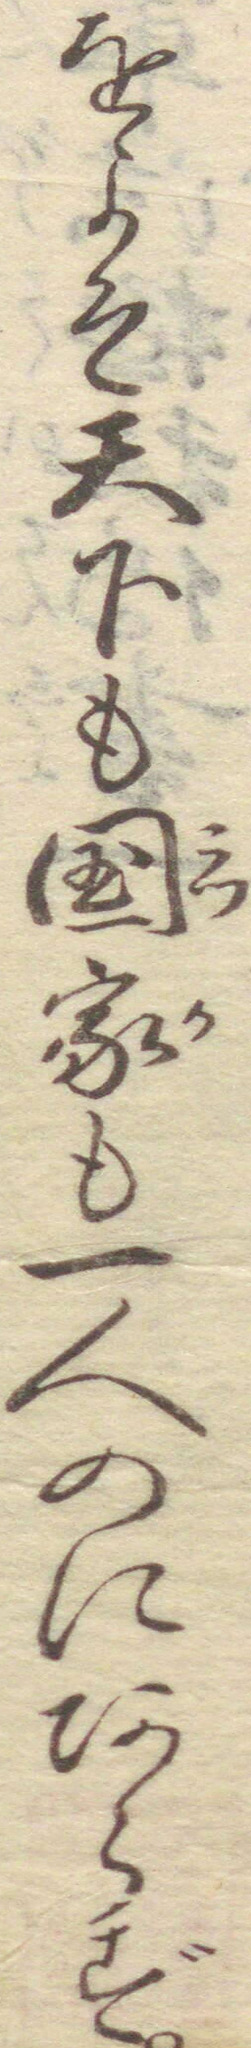をよそ天下も国家も一人のにあらず。
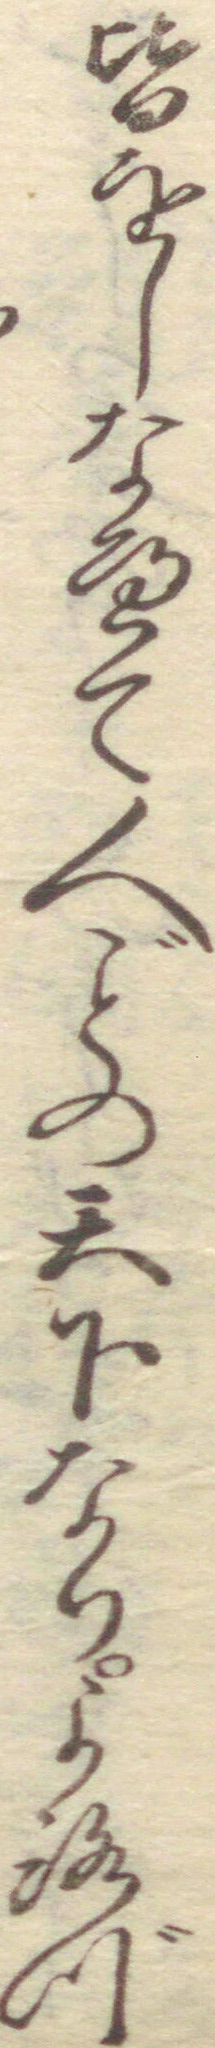皆をしなへて人ごとの天下なり。よろづ
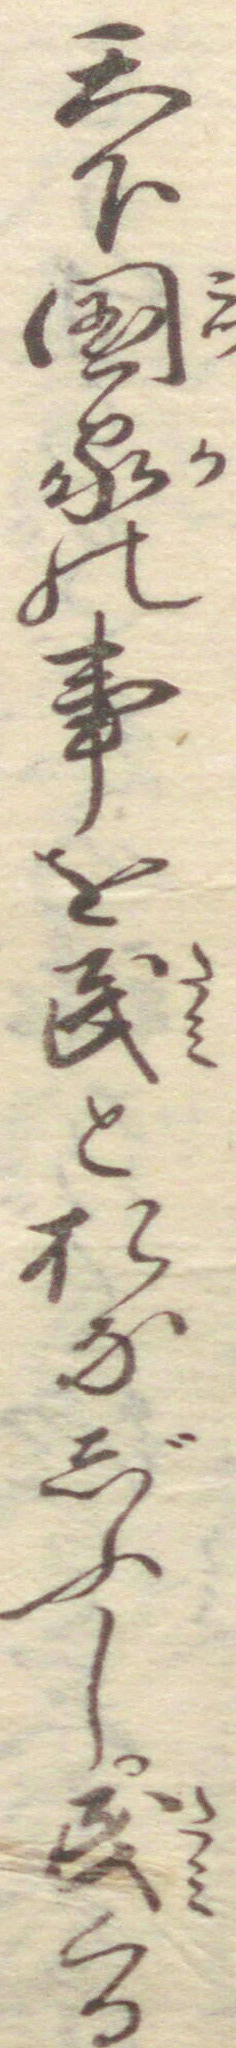天下国家の事を民とおなじふし。民くる
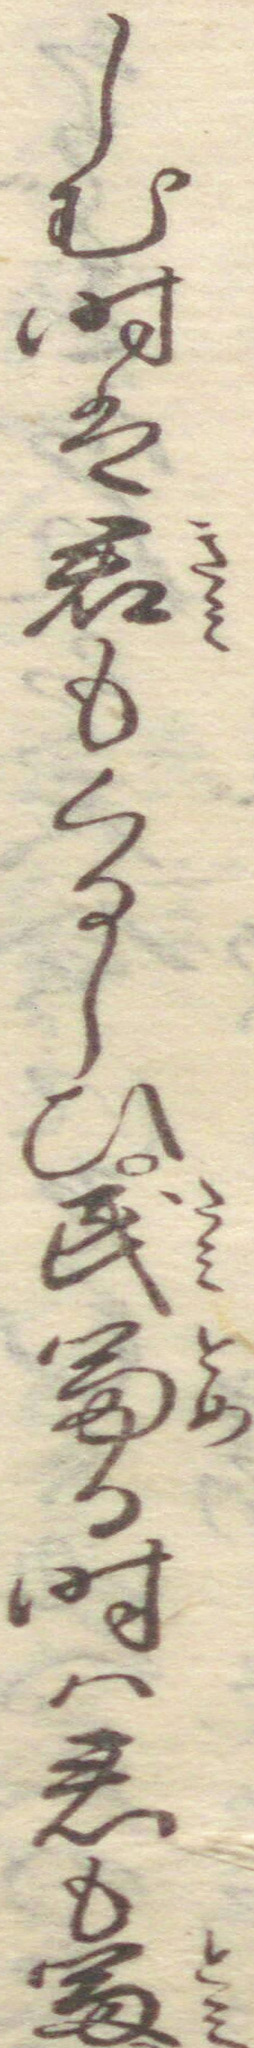しむ時は君もくるしひ。民富る時は君も富。
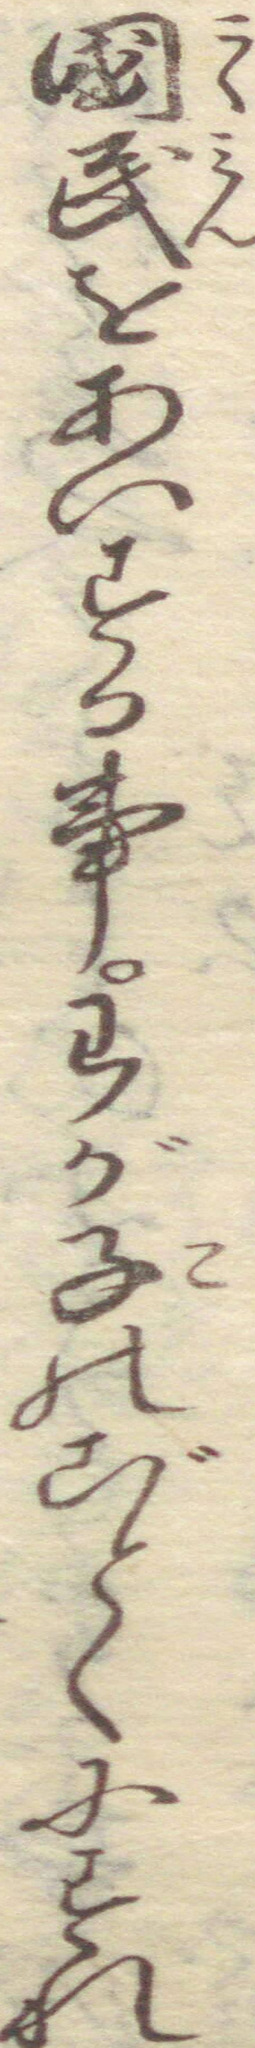国民をあいする事。わが子のごとくにすれ
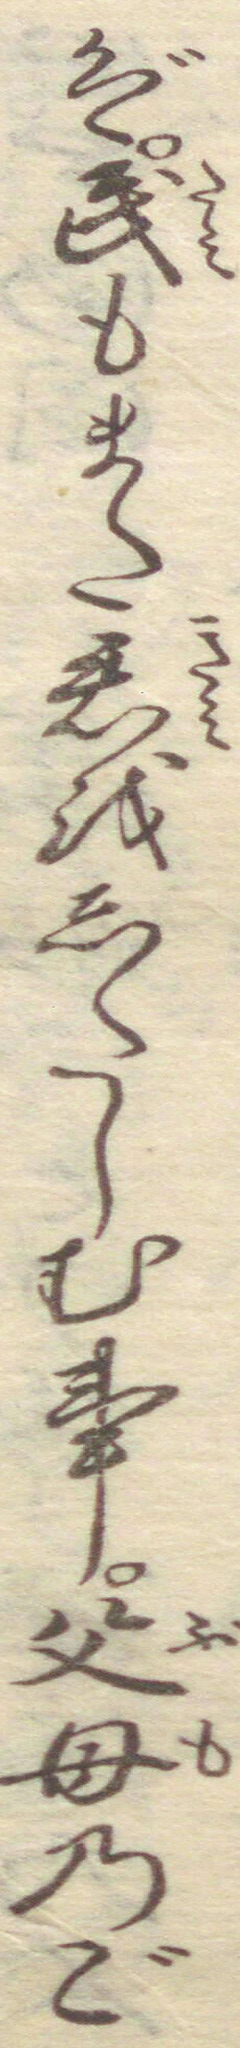ば。民もまた君をしたしむ事。父母のご
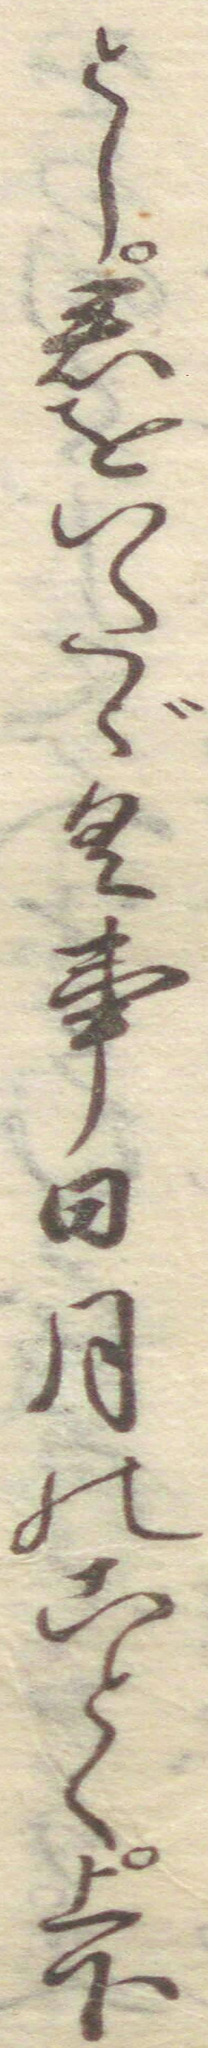とし。君をいたゞく事日月のことく。上下
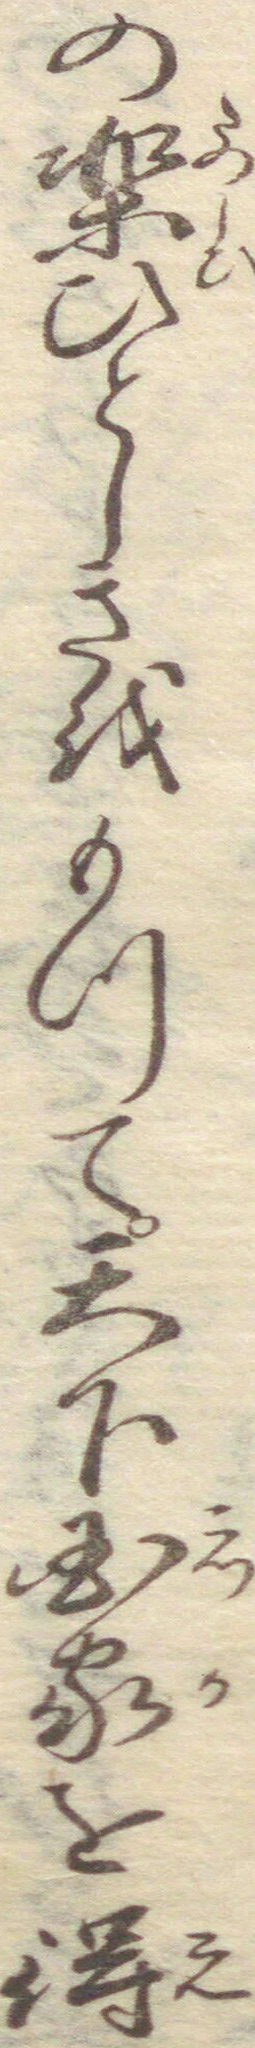の楽ひとしきをもつて。天下国家を得
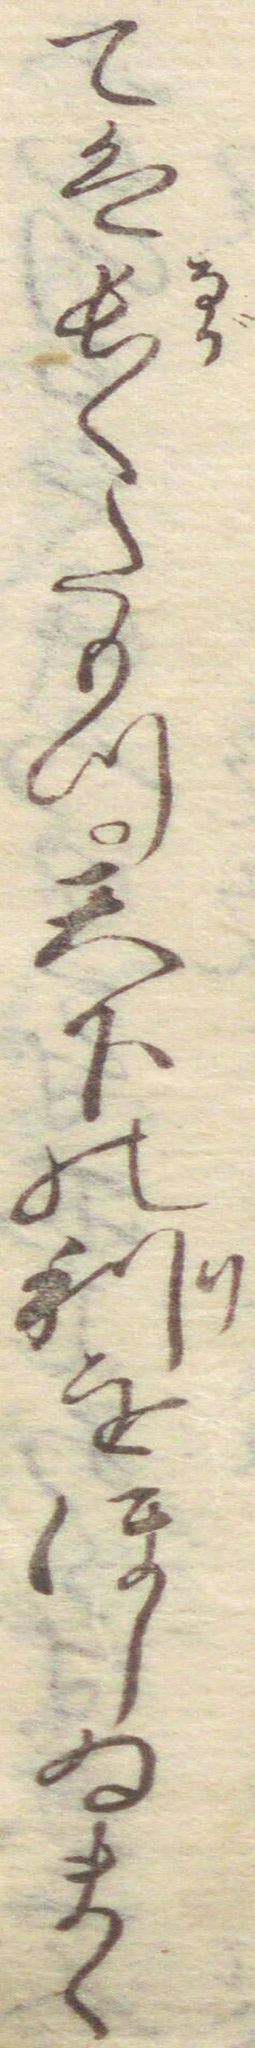ては長くたもつ。天下の利をほしゐまゝ
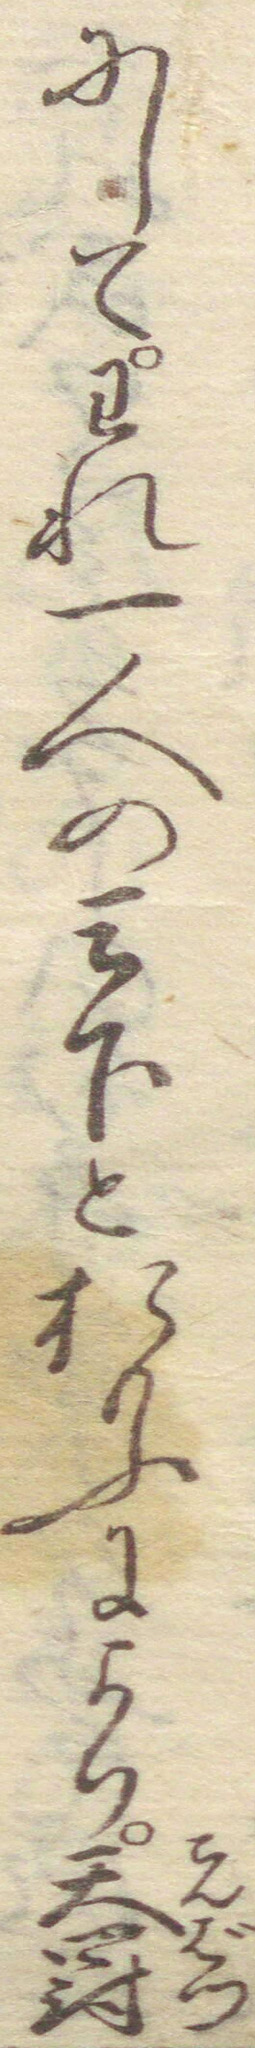にして。われ一人の天下とおもふにより。天罰
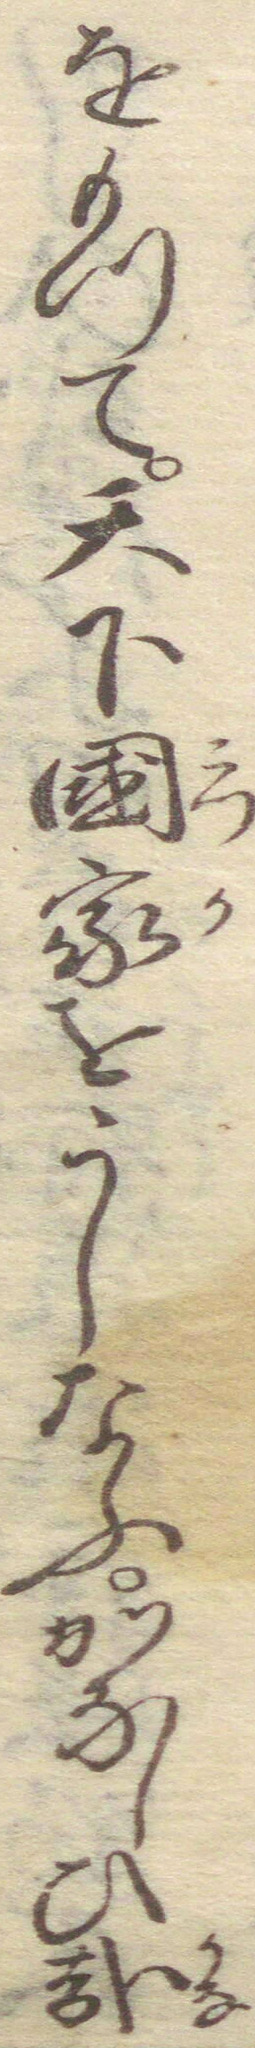をもつて。天下国家をうしなふ。かなしひ哉

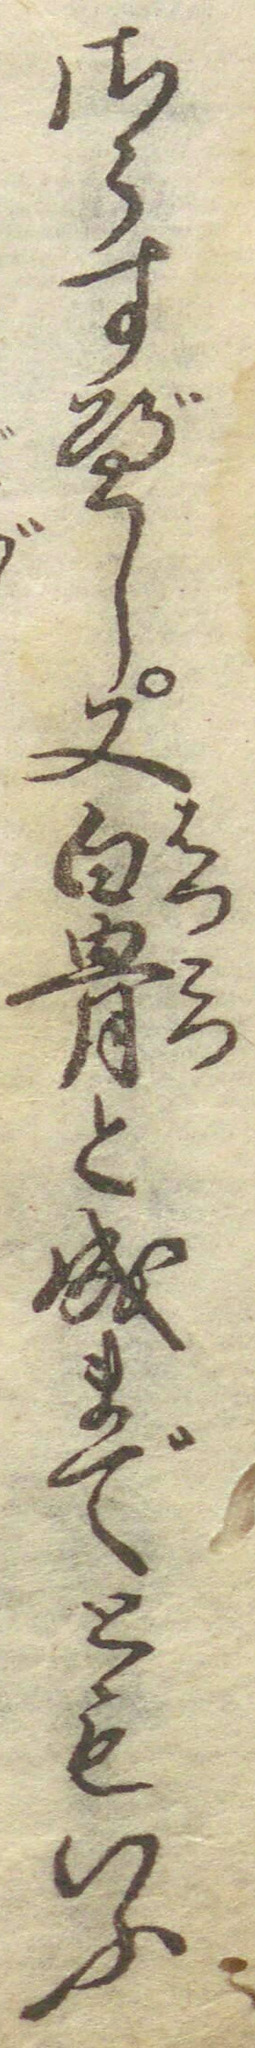さらすべし。又白骨と成までともいふ
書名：軍法極秘傳書
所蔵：国文学研究資料館
